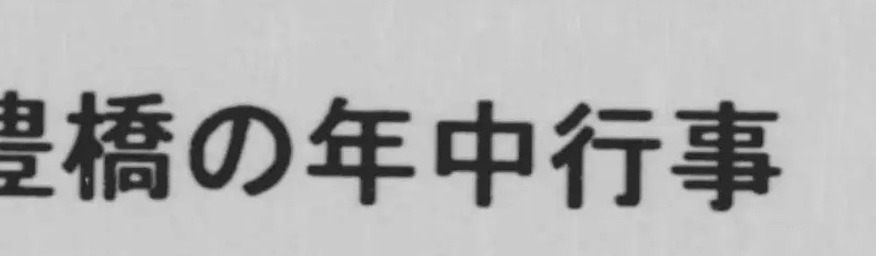豐橋の年中行事
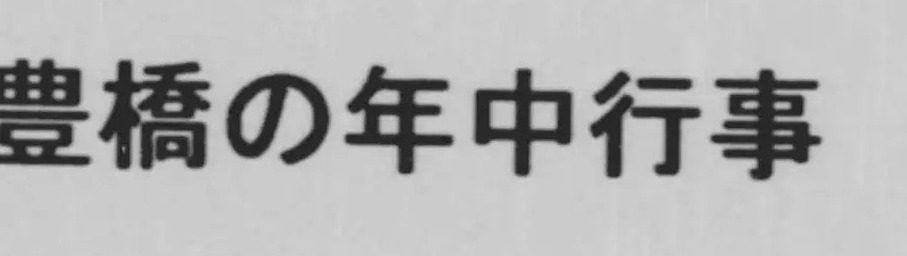豐橋の年中行事
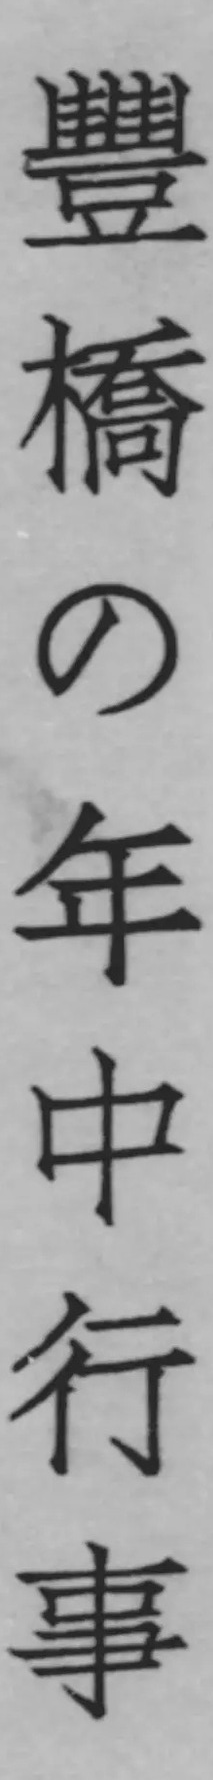豐橋の年中行事
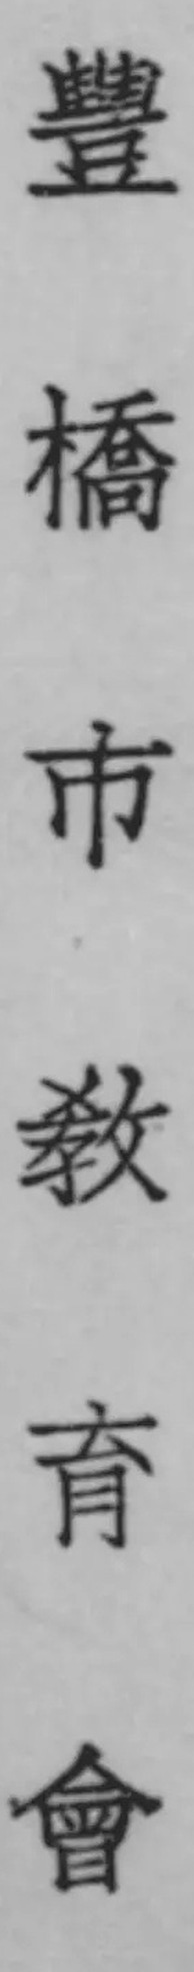豐橋市敎育會

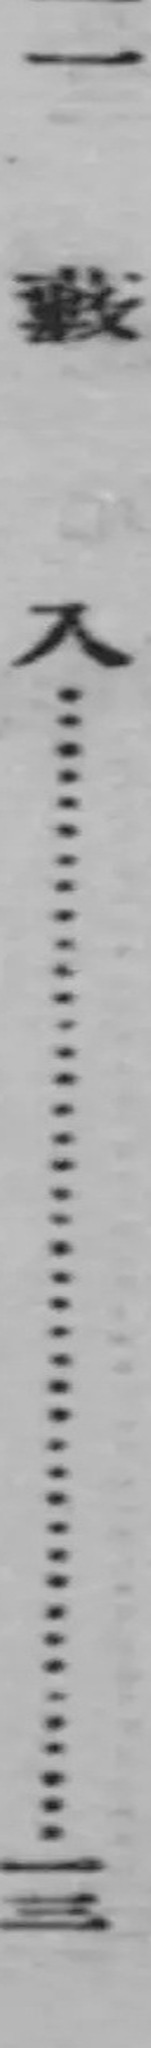三一藪入……………………………一三

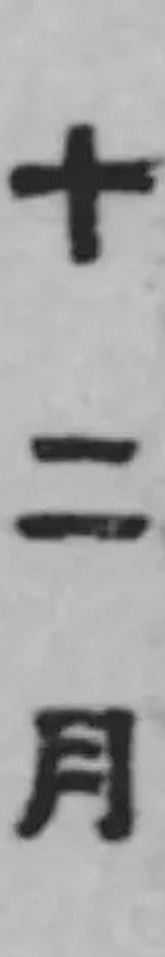十二月
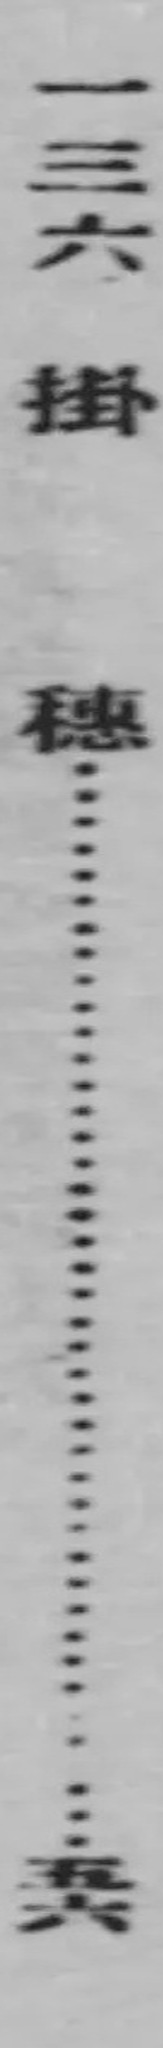一三六掛穗……………………………五六
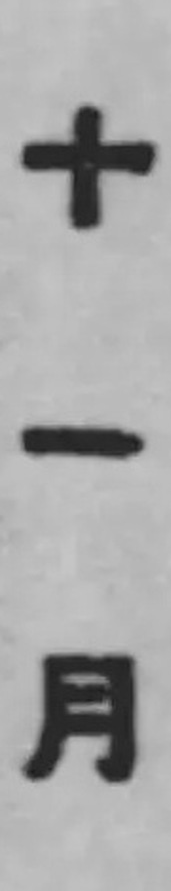十一月

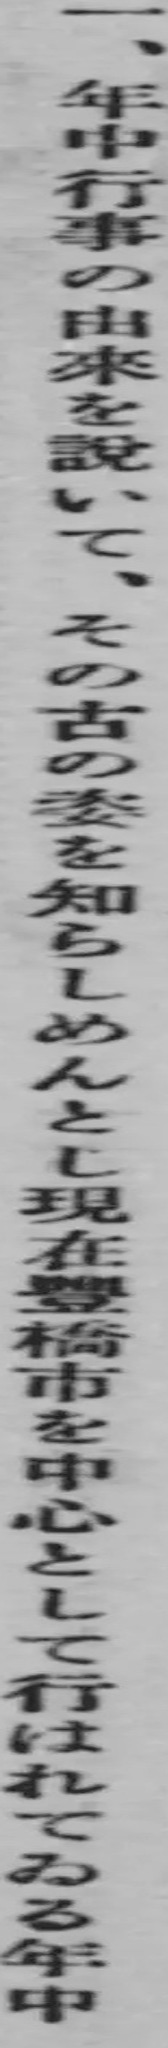一、年中行事の由來を說いて、その古の姿を知らしめんとし現在豐橋市を中心として行はれてゐる年中
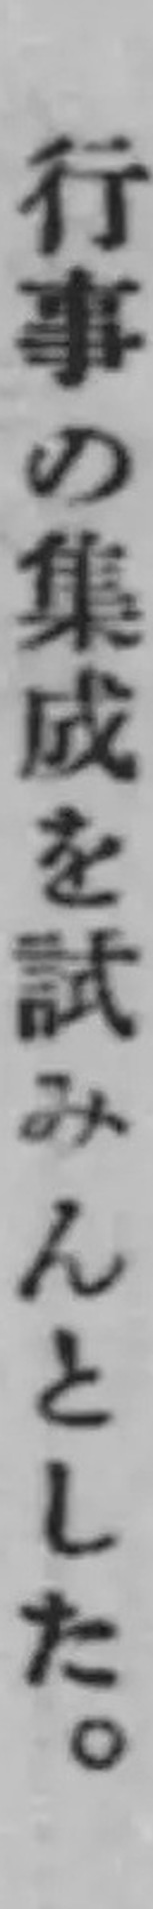行事の集成を試みんとした。
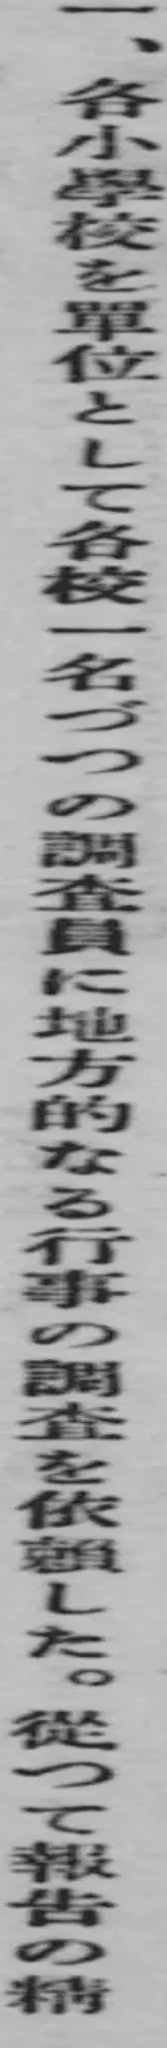一、各小學校を單位として各校一名づつの調査員に地方的なる行事の調査を依頼した。從つて報告の精
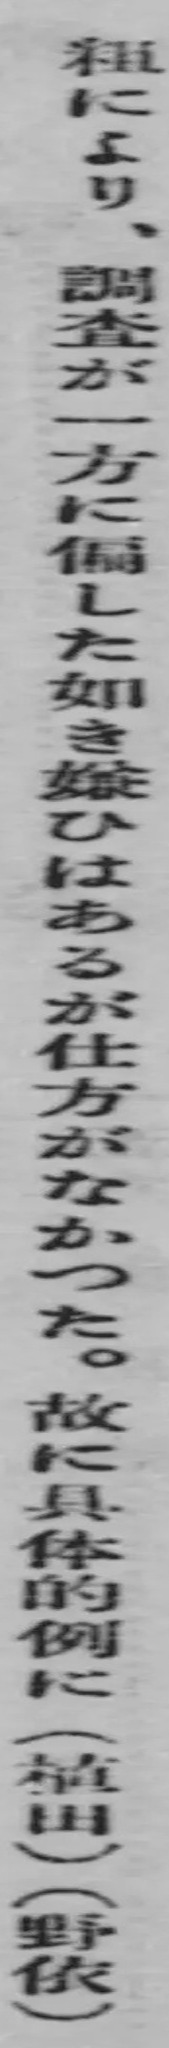粗により、調査が一方に偏した如き嫌ひはあるが仕方がなかつた。故に具体的例に(植田)(野依)
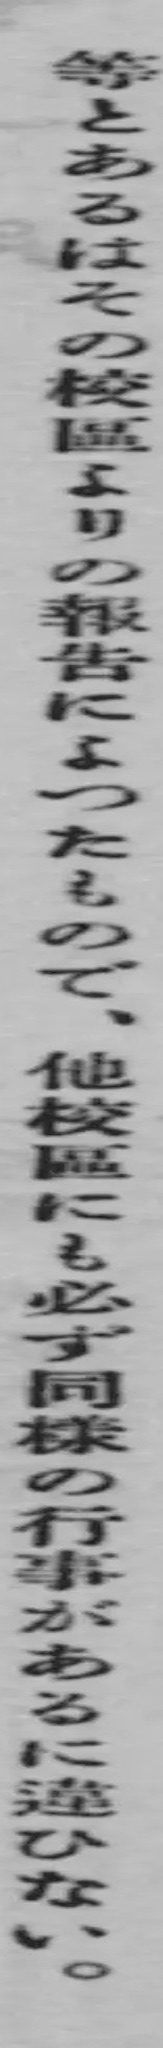等とあるはその校區よりの報告によつたもので、他校區にも必ず同様の行事があるに違ひない。
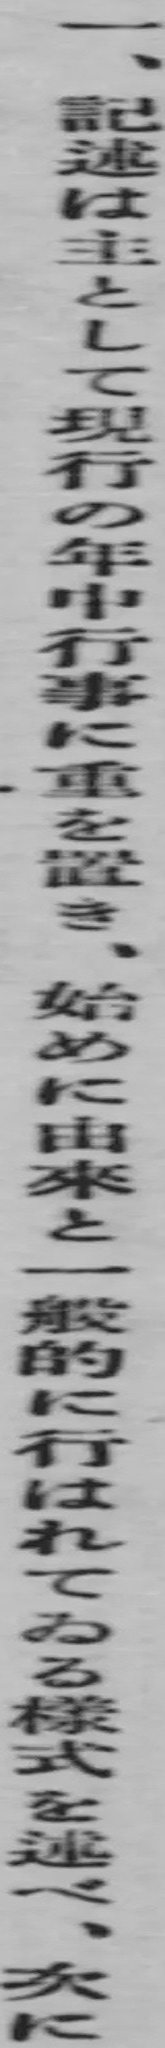一、記述は主として現行の年中行事に重を置き、始めに由來と一般的に行はれてゐる様式を述べ、次に
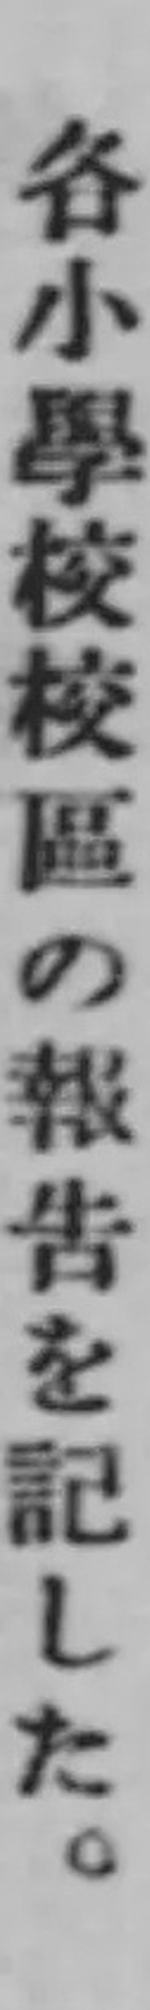各小学校校區の報告を記した。
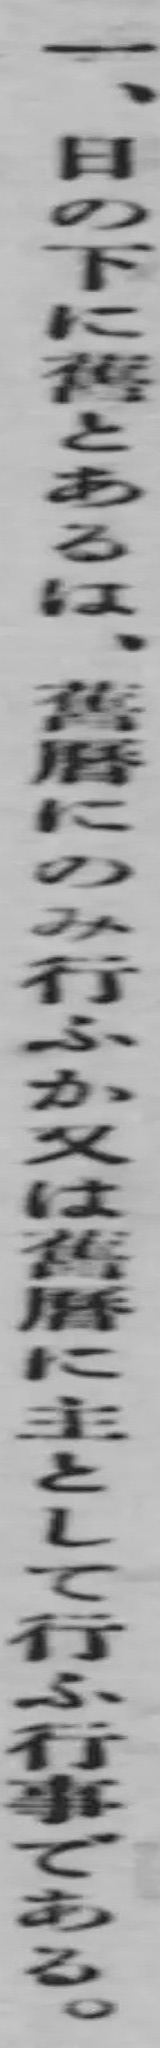一、日の下に舊とあるは、舊曆にのみ行ふか又は舊曆に主として行ふ行事である。
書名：豊橋の年中行事
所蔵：国立国会図書館 National Diet Library, JAPAN
